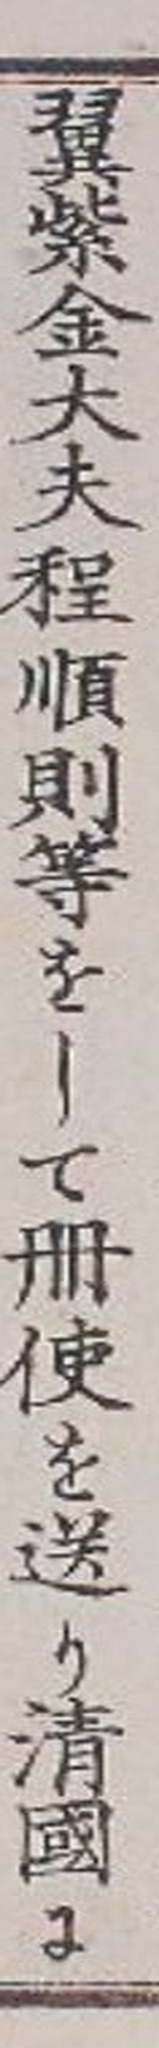翼紫金大夫程順則等をして冊使を送り清国に
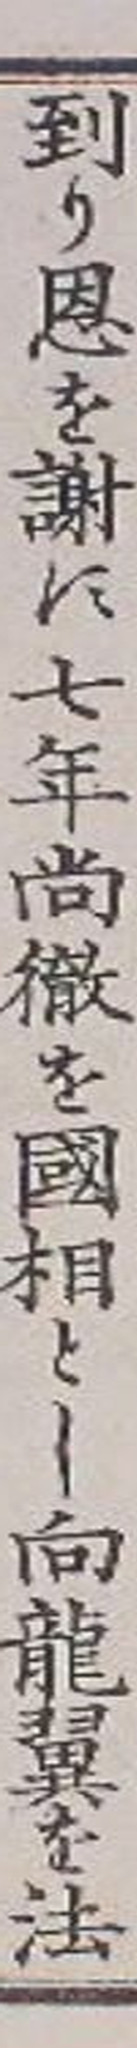到り恩を謝す七年尚徹を国相とし向龍翼を法
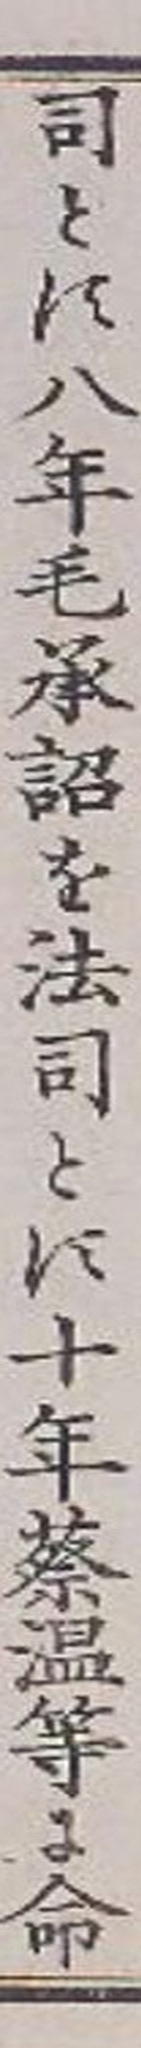司とす八年毛承詔を法司とす十年蔡温等に命
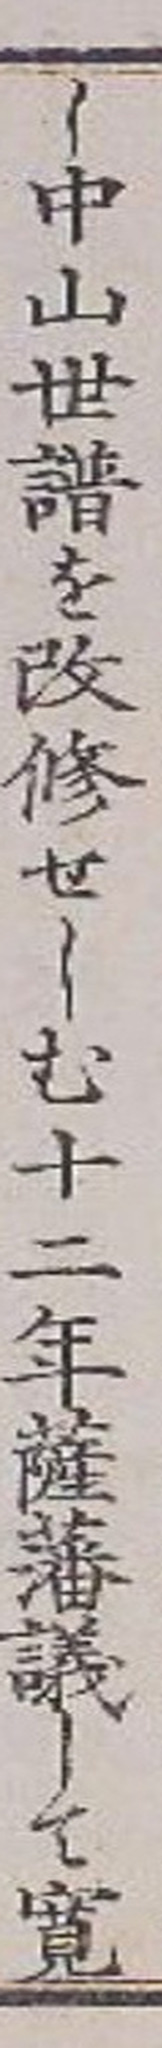し中山世譜を改修せしむ十二年薩藩議して寛
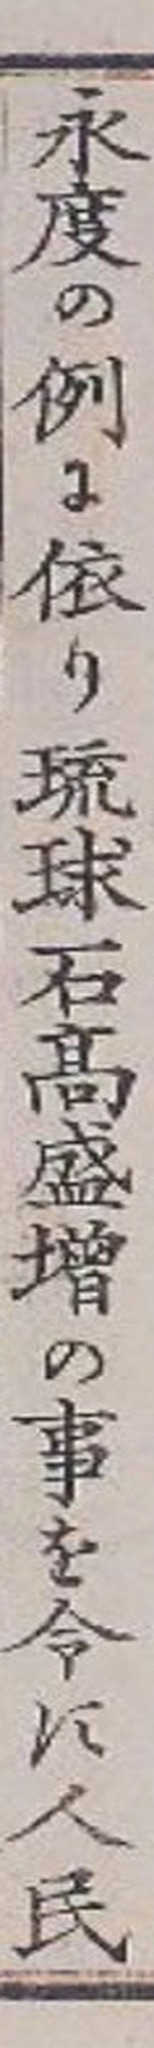永度の例に依り琉球石高盛増の事を令す人民

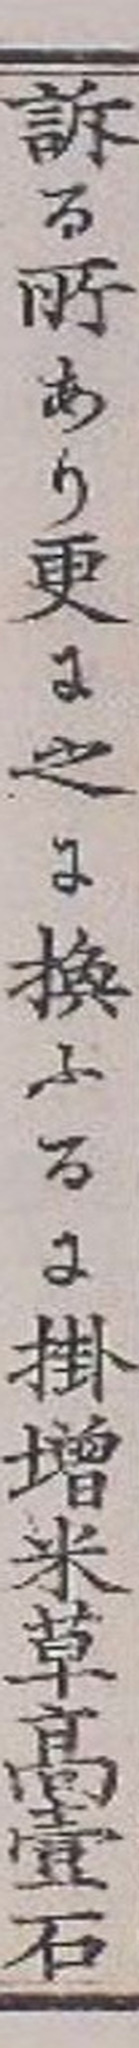訴る所あり更に之に換ふるに掛増米草高台石
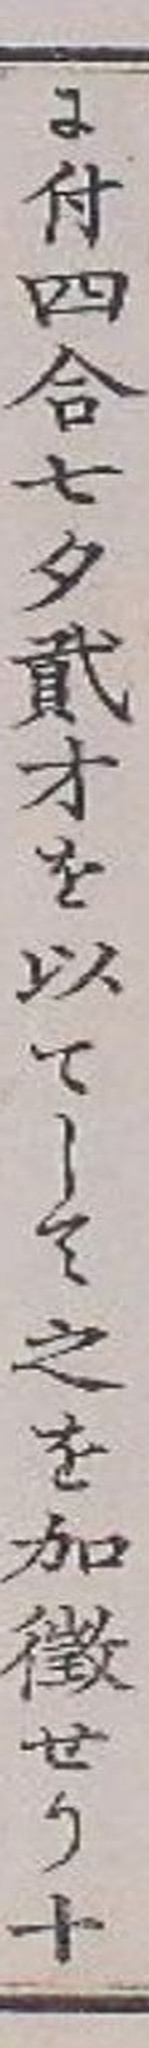に付四合七勺弐才を以てして之を加徴せり十
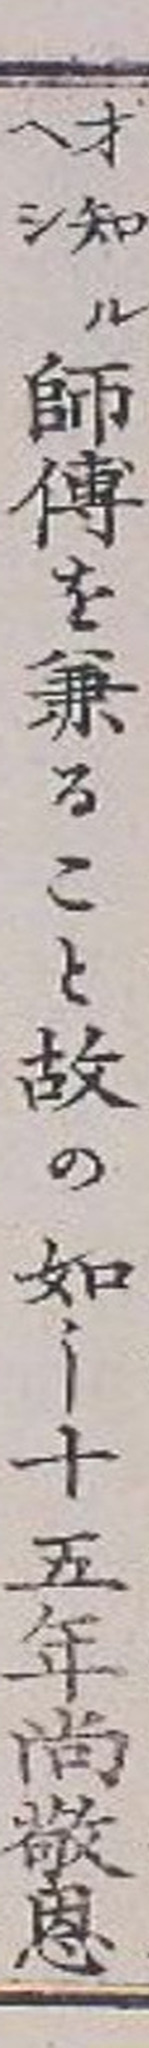才知ルヘシ師伝を兼ること故の如し十五年尚敬恩
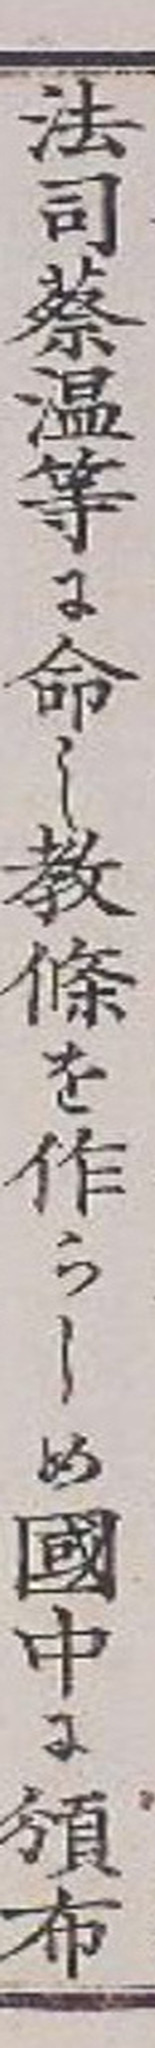法司蔡温等に命し教条を作らしめ国中に頒布
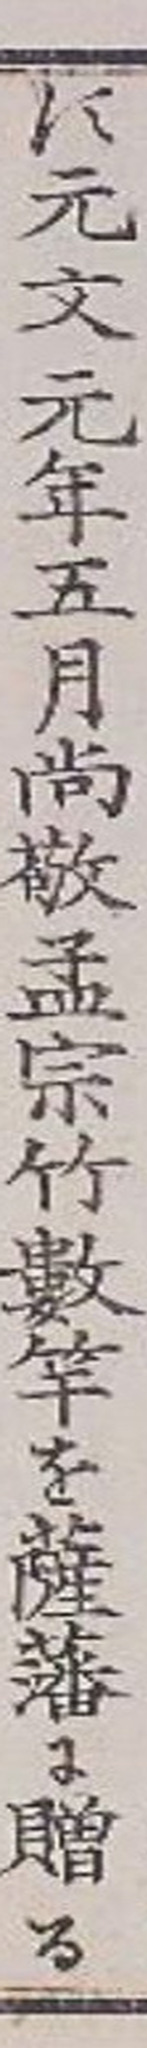す元文元年五月尚敬孟宗竹数竿を薩摩に贈る
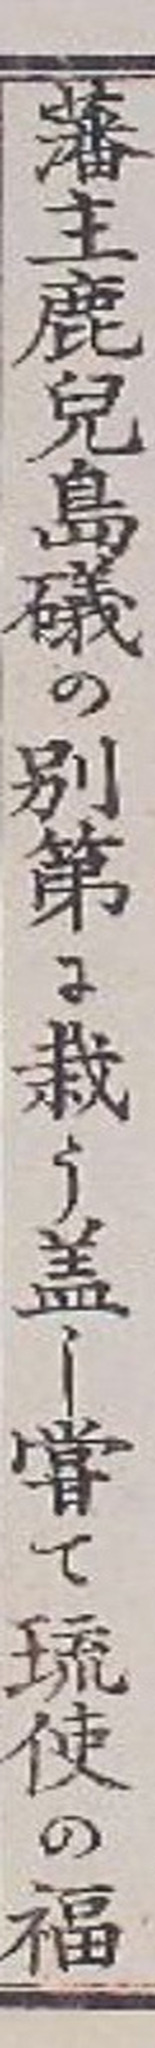藩主鹿児島礒の別第に栽う盖し嘗て琉使の福
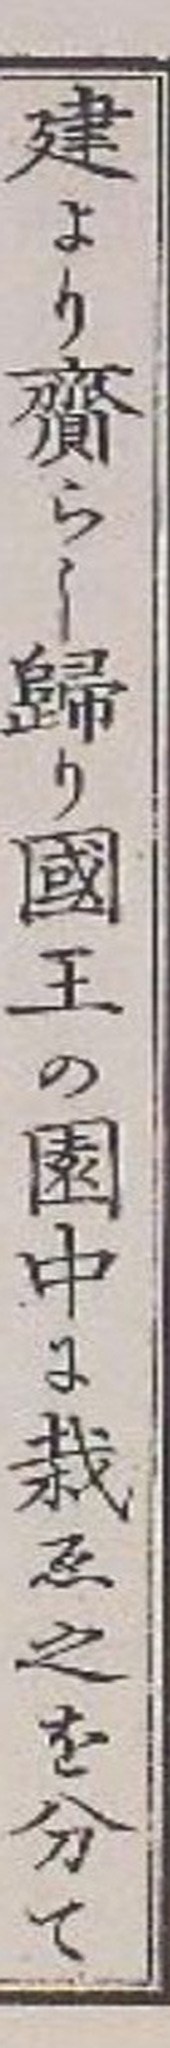建より齎らし帰り国王の園中に栽ゑ之を分て
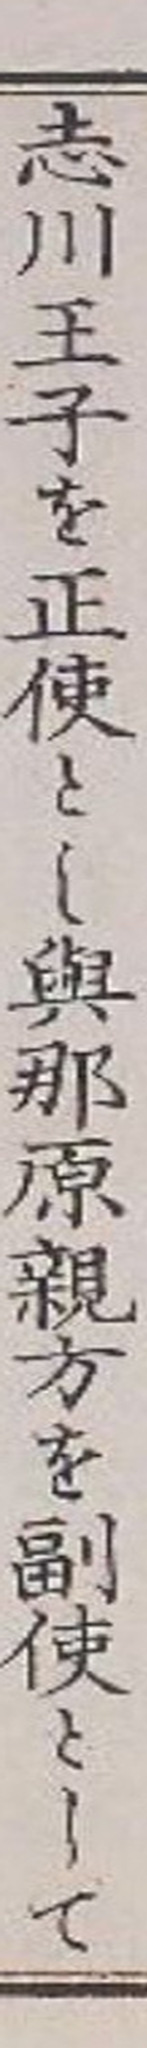志川王子を正使とし与那原親方を副使として
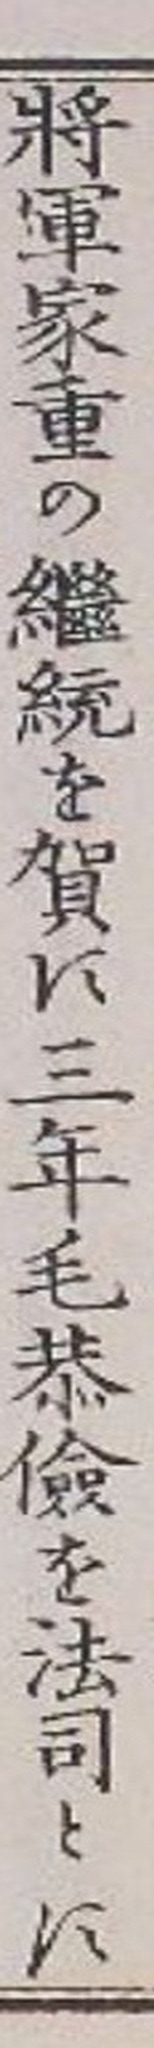将軍家重の継統を賀す三年毛恭倹を法司とす
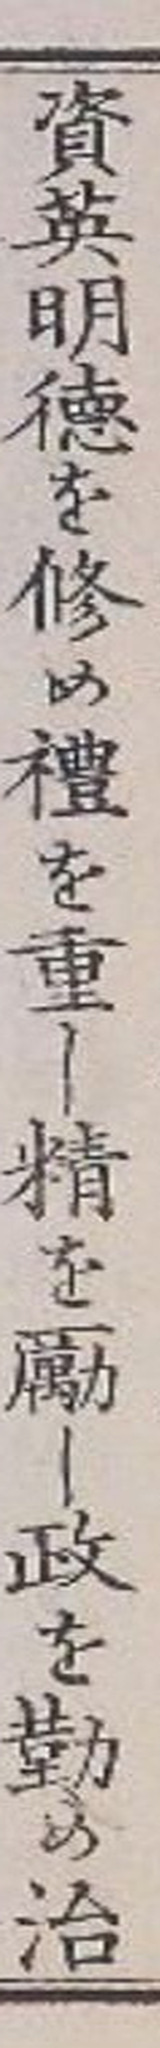資英明徳を修め礼を重し精を励し政を勤め治
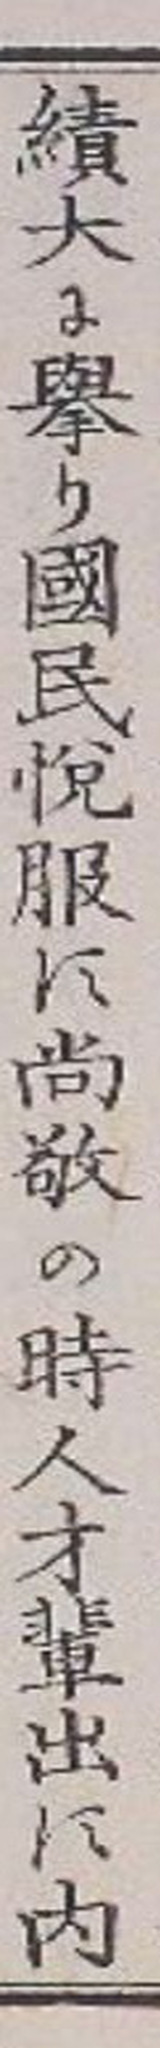績大に挙り国民悦服す尚敬の時人才輩出す内
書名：南島紀事 下
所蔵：University of the Ryukyus Library
